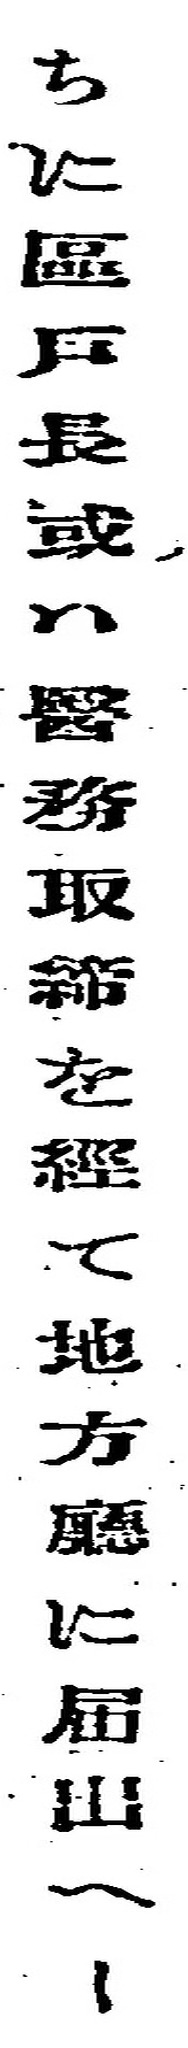ちに区戸長或は医務取締を経て地方庁に届出へし
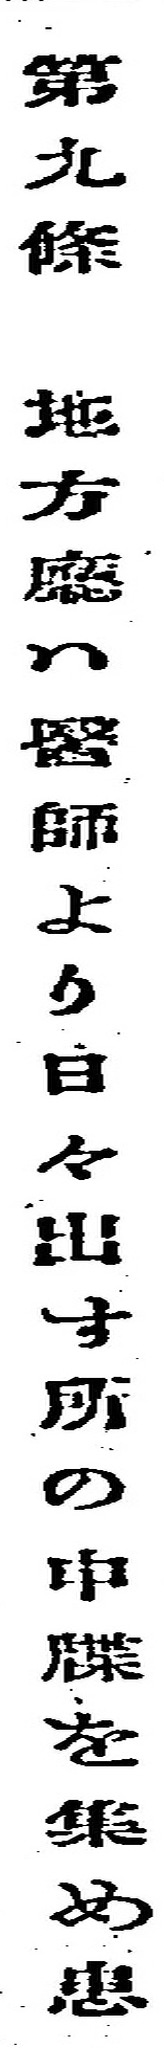第九条地方庁は医師より日々出す所の申牒を集め患
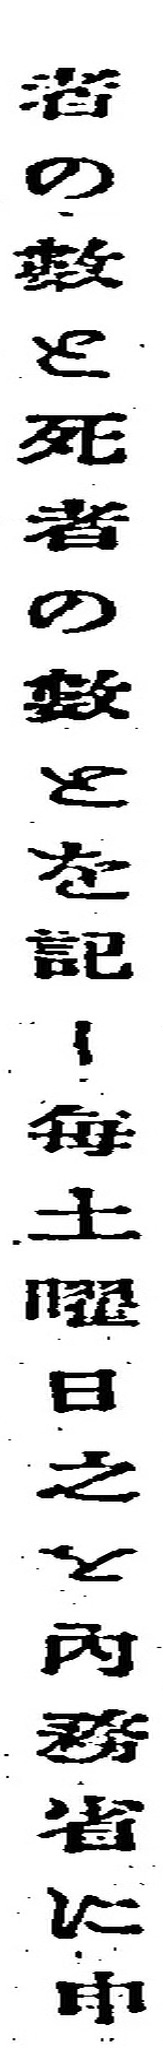者の数と死者の数とを記し毎土曜日之を内務省に申
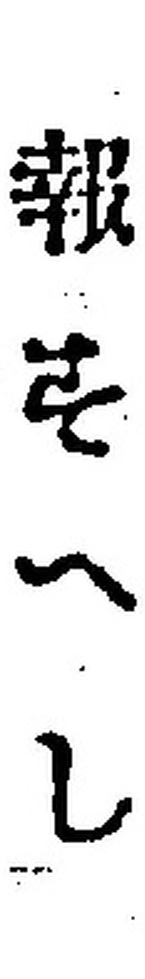報すへし
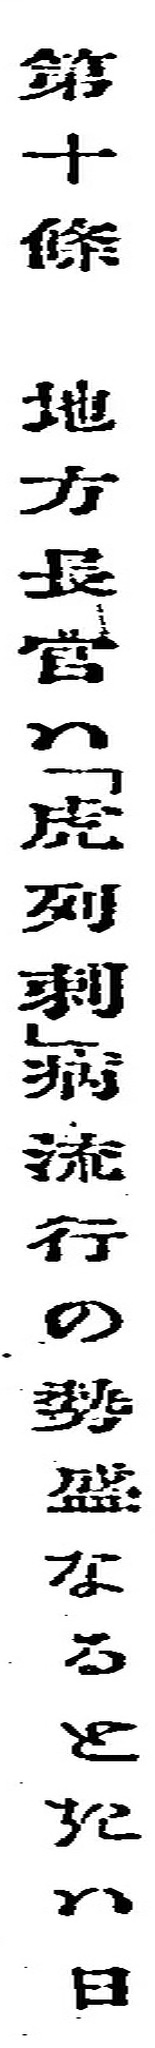第十条地方長官は「虎列刺」病流行の勢盛なるときは日
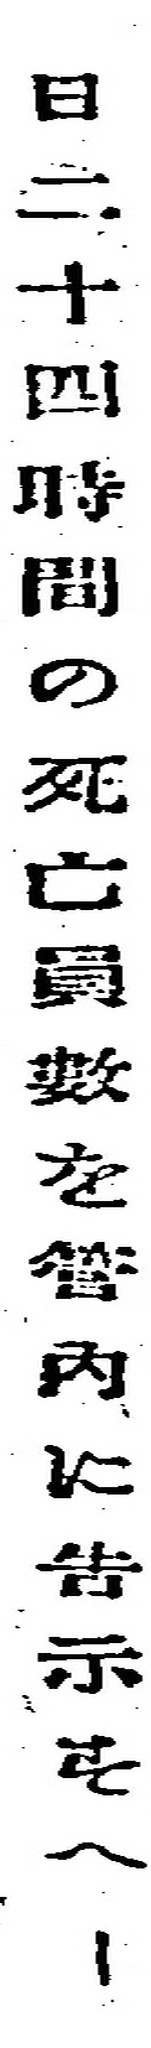日二十四時間の死亡員数を管内に告示すへし
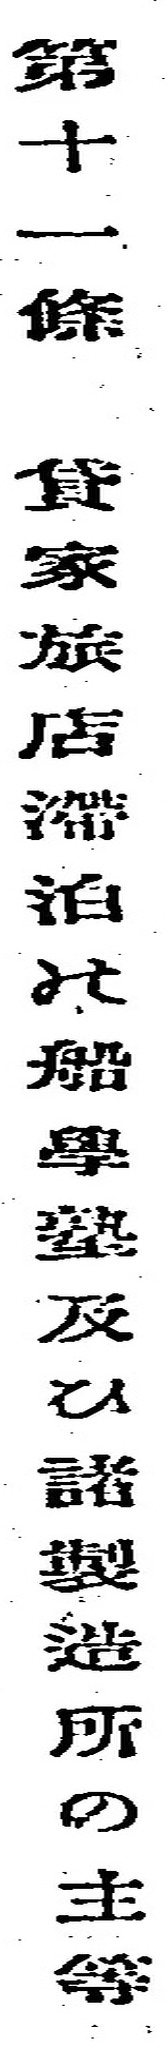第十一条貸家旅店滞泊の船学塾及ひ諸製造所の主等
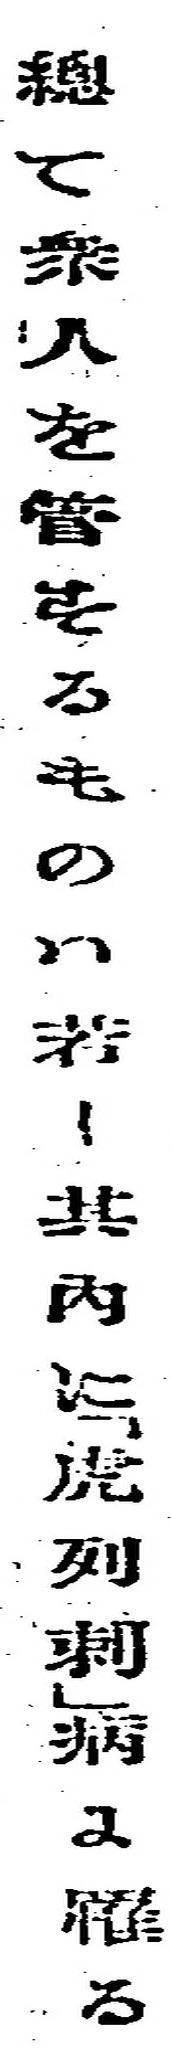総て衆人を管するものは若し其内に「虎列刺」病に罹る
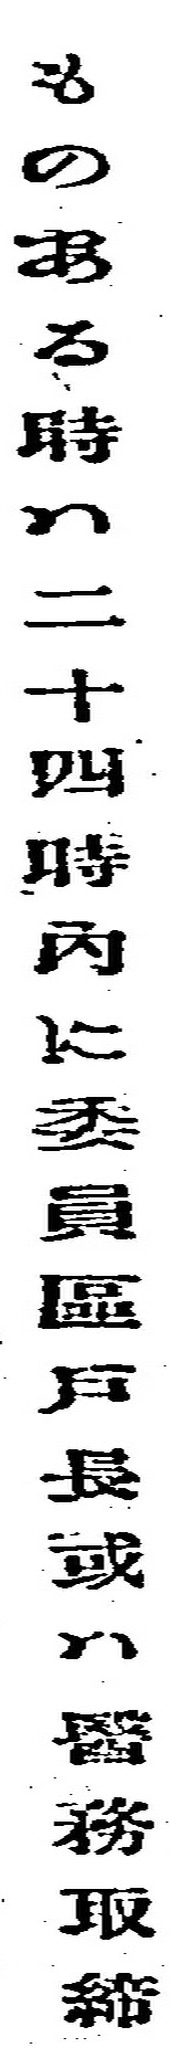ものある時は二十四時内に委員区戸長或は医務取締
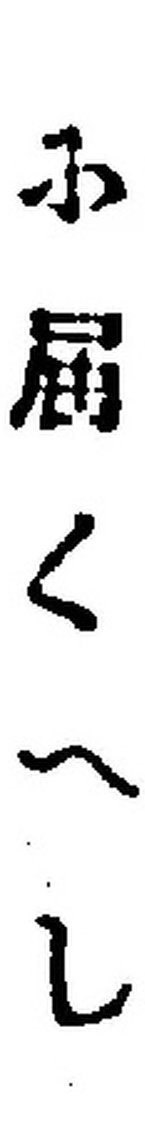に届くへし
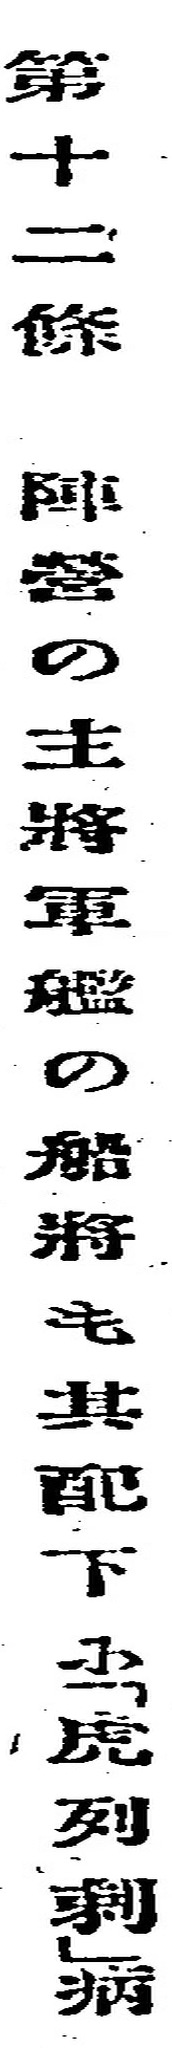第十二条陣営の主将軍艦の船将も其配下に「虎列刺」病
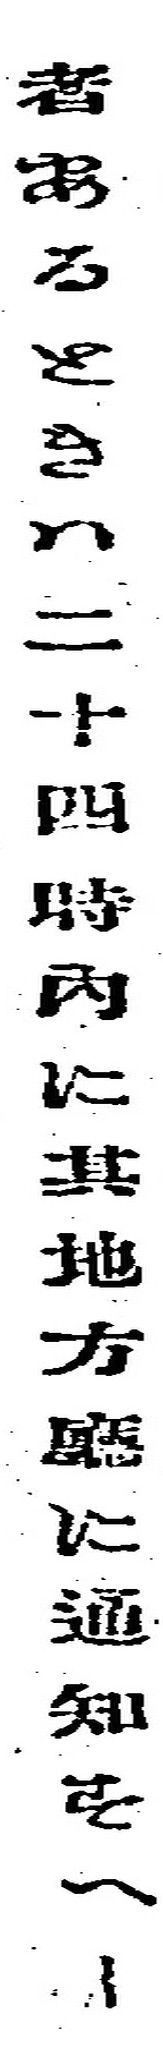者あるときは二十四時内に其地方庁に通知すへし
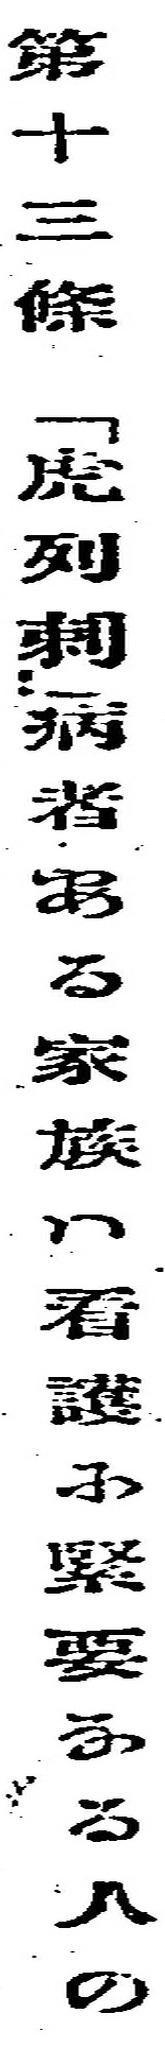第十三条「虎列刺」病者ある家族は看護に緊要なる人の
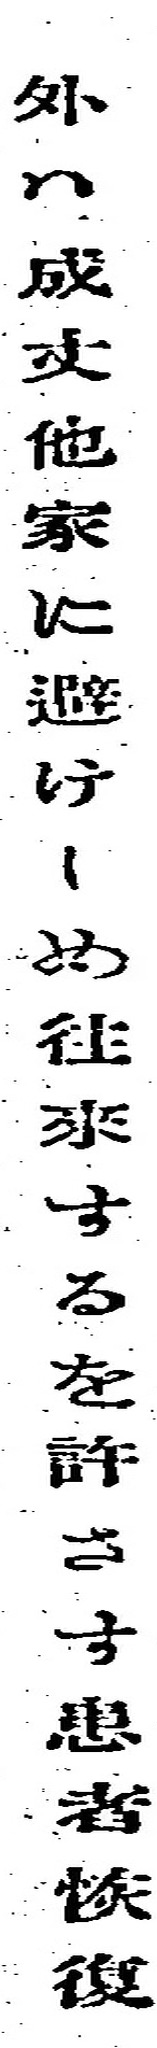外は成丈他家に避けしめ往来するを許さす患者恢復

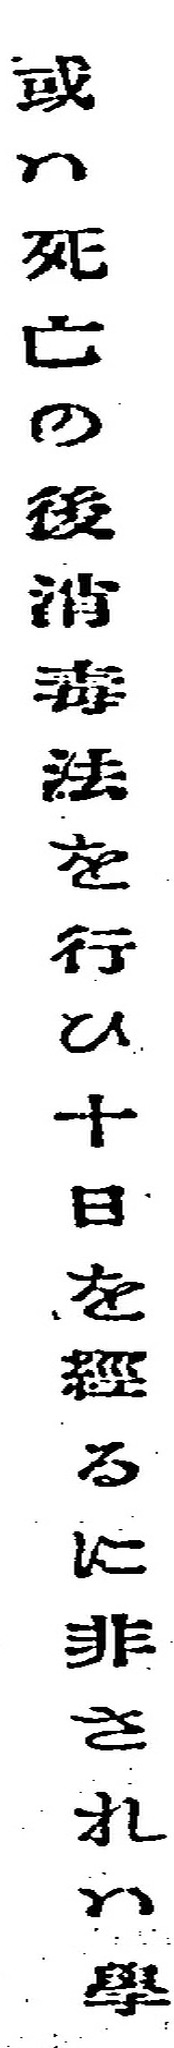或は死亡の後消毒法を行ひ十日を経るに非されは学
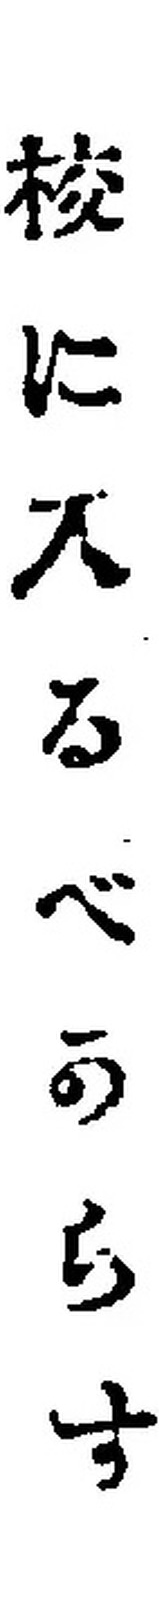校に入るべからす
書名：これら病予防心得
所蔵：国立国会図書館 National Diet Library, JAPAN
